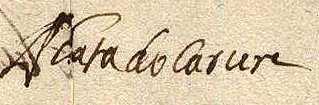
Pl_ta do carcere
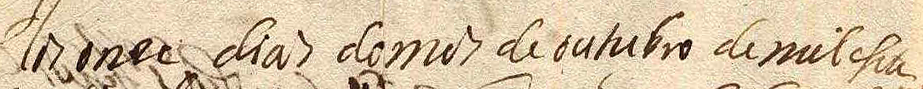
Aos onze dias do mes de outubro de mil e sete
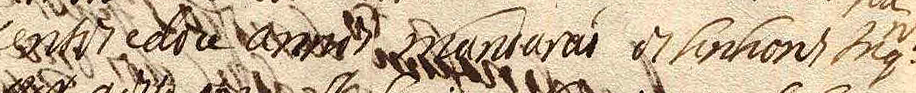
centos e doze annos mandaraõ os senhores Inq.res
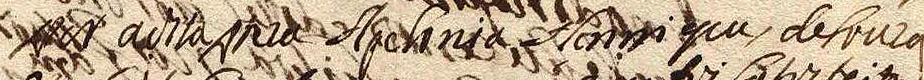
por a dita preza Apelonia Henrriques de souza
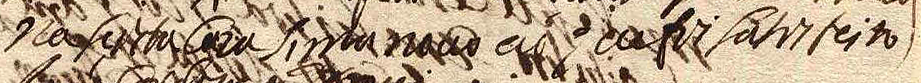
na seista caza sima nouo ao que foi satisfeito,
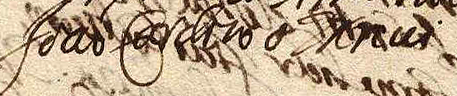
Joaõ Cardozo o Escreui
